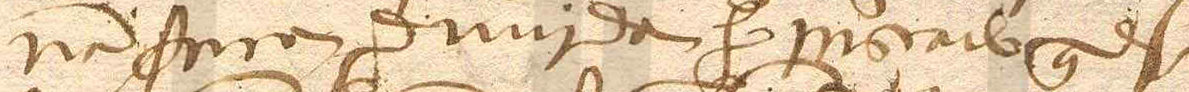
nā faca duujda ho rriscado q̄ djz
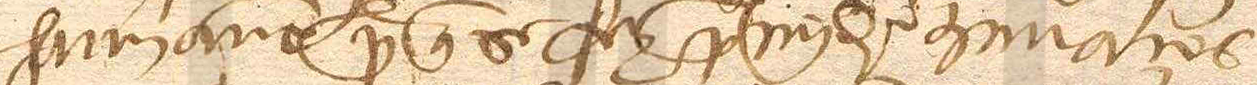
hum an̄o p̄o q̄ se fez p̄o mȳ djo trauaços
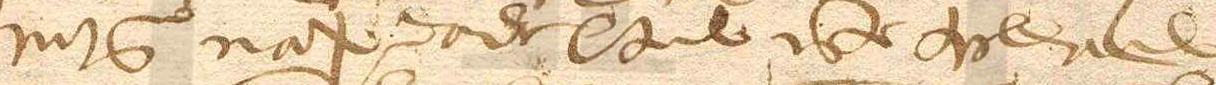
notro na ꝟdade e tudo este trellado
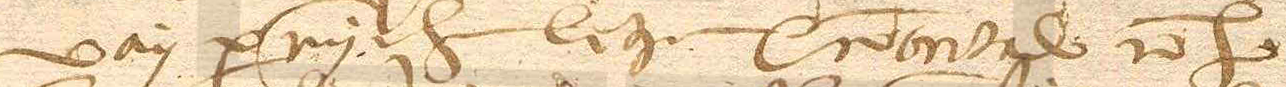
vay ꝑ m̄jnha letra e c̄ocertado cō ho
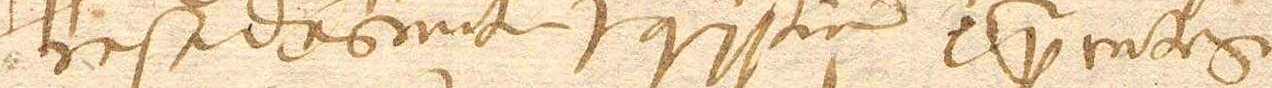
casa da santa Jnqujsiçā e p̄o certeza
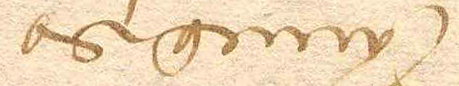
asigneey /
